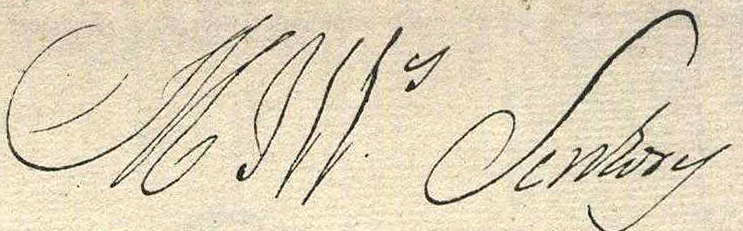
M Ill.es Senhores
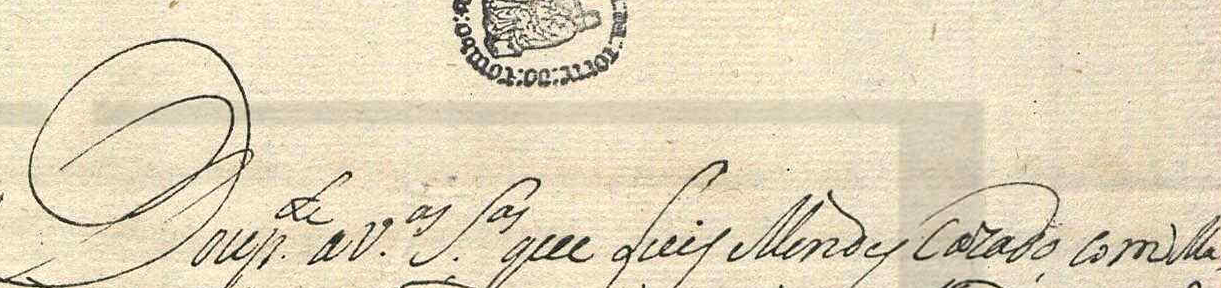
Dou p.te a V.as S.as que Luis Mendes cazado com Ma
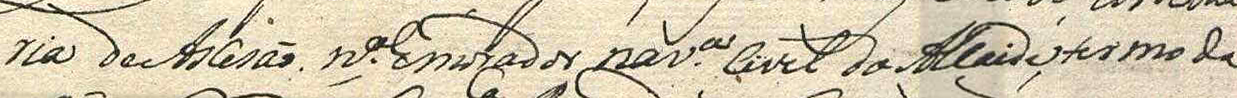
ria de Ascesaõ. n.al e morador na v.a civel do Alcaide, termo da
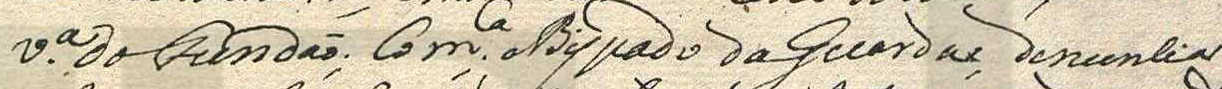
v.a do Fundaõ; Com.ca e Bispado da Guarda, denuncia
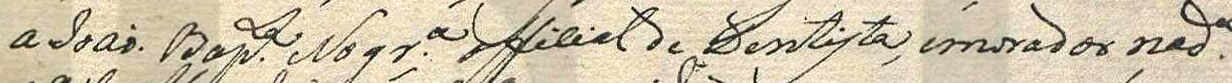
a Ioaõ. Bap.ta Nogr.a official de Dentista, e morador na d.a
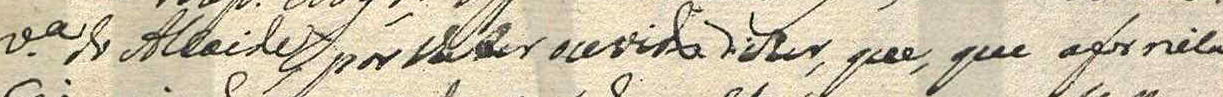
v.a do Alcaide por lhe ter ouvido dizer, que, que a fornica
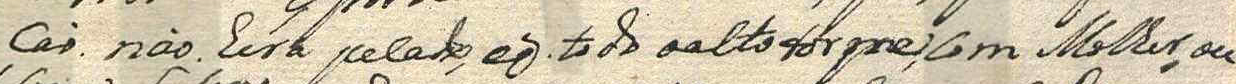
çaõ naõ hera pecado, e q̄ todo o aCto torpe, com Molher, ou
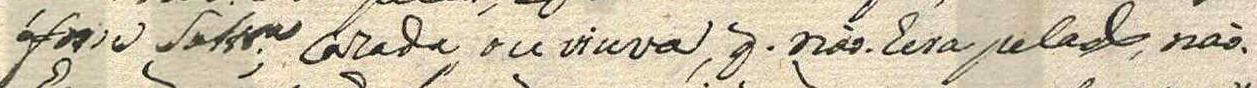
o fosse Soltr.a, cazada, ou viuva, q̄ naõ hera peCado, naõ.
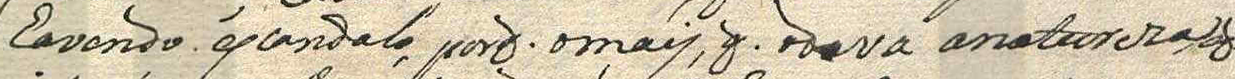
havendo. escandalo, porq̄. o mais, q̄ o dava a natureza, q̄
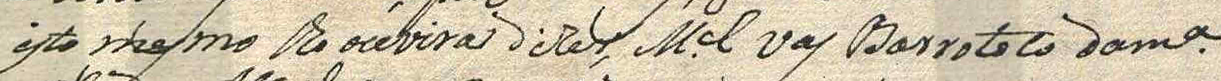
isto mesmo lhe ouvira dizer, M.el vas Barrotoco da m.a
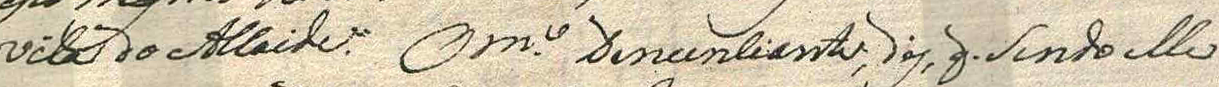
vila do AlCaide. O m.o Denunciante, dis, q̄ sendo elle
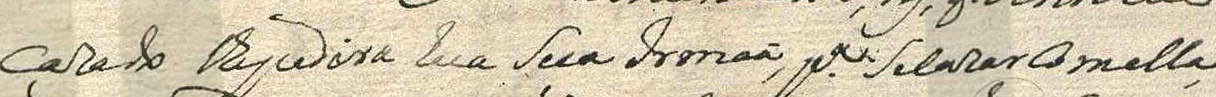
cazado lhe pedira hua Sua Irmaã, p.a se cazar com ella,
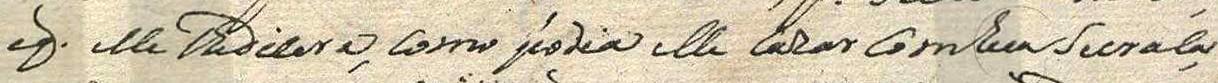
e q̄ elle lhe dicera, como podia elle cazar com hua se era ca
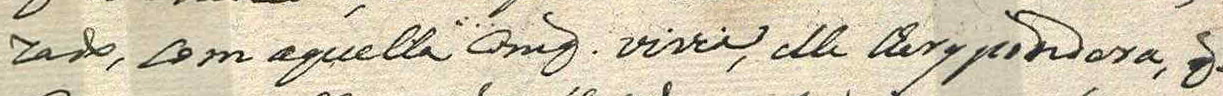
zado, com aquella com q̄ vivia, elle lhe respondera, q̄
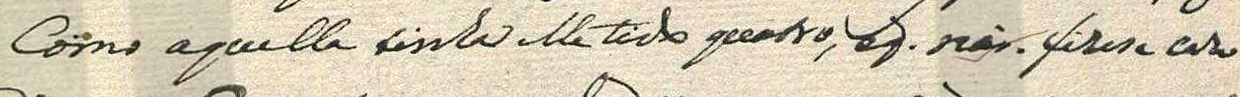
Como aquella tinha elle tido quatro, e q̄. naõ fizese cazo
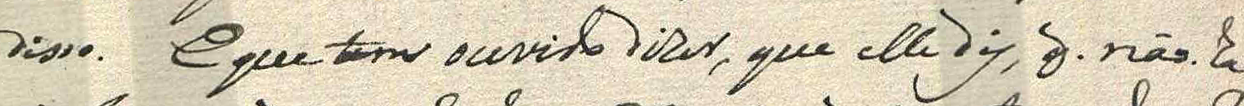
disso. E que tem ouvido dizer, que elle dis, q̄. não ha
